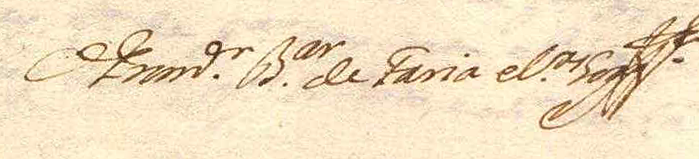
O Prom.or B.ar de Faria e V.aslos
